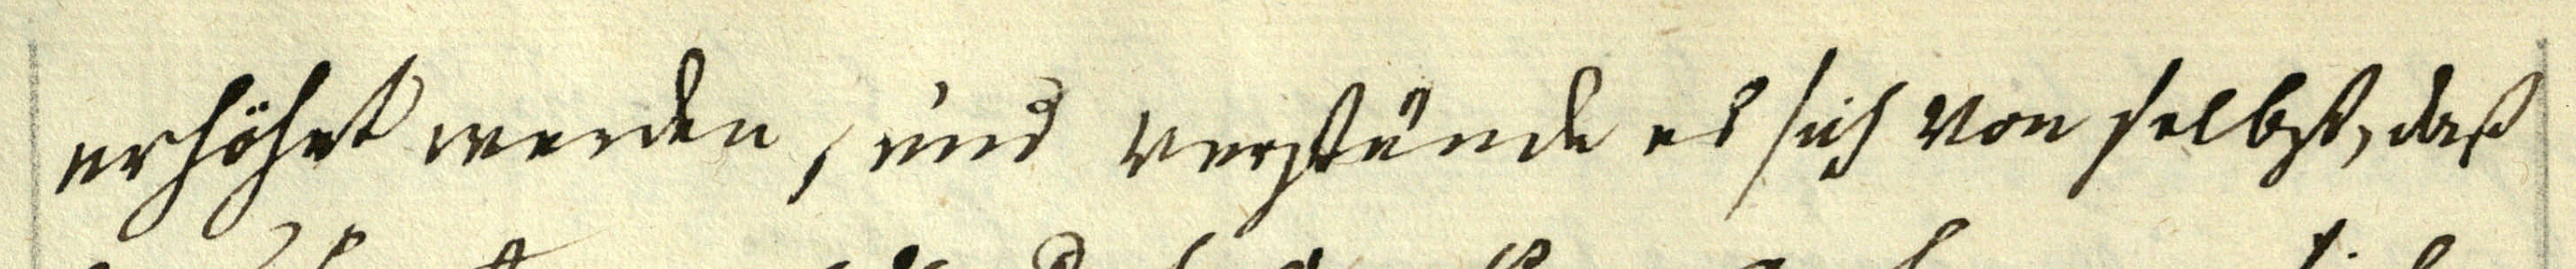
erhöhet werden, und verstünde es sich von selbst, daß
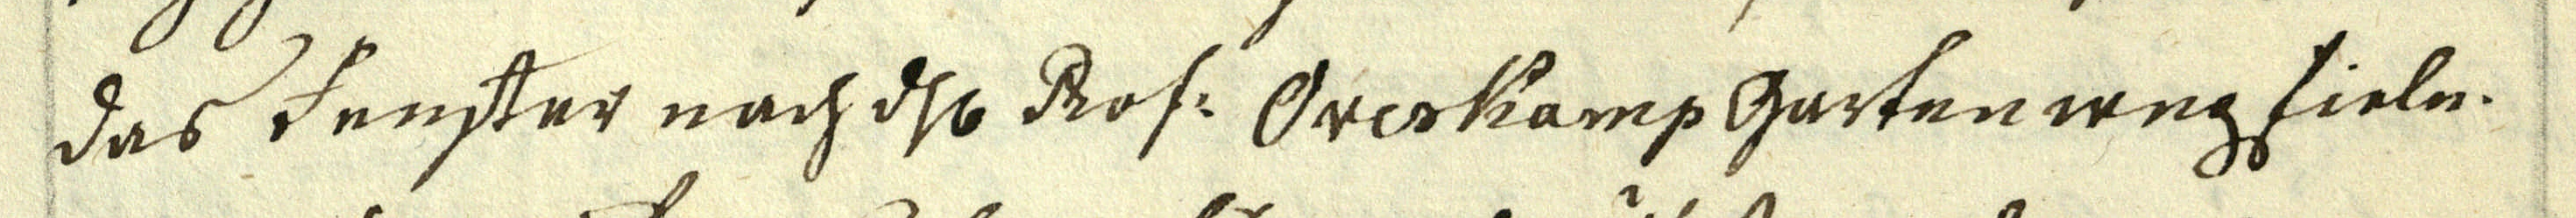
das Fenster nach dh Prof. Overkamp Garten wegfiele.
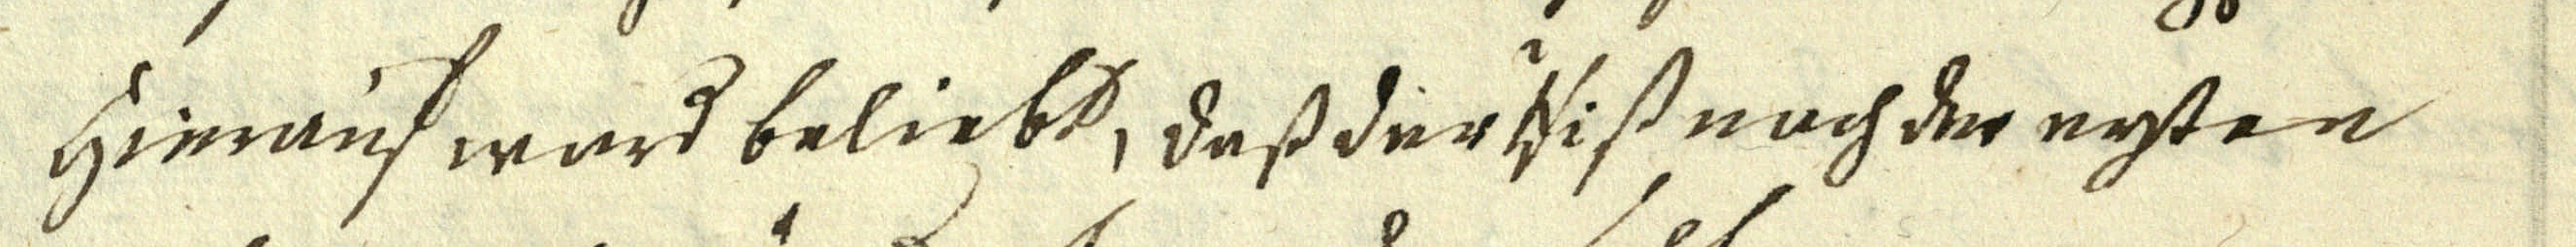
Hierauf ward beliebt, daß der Riß nach der ersten
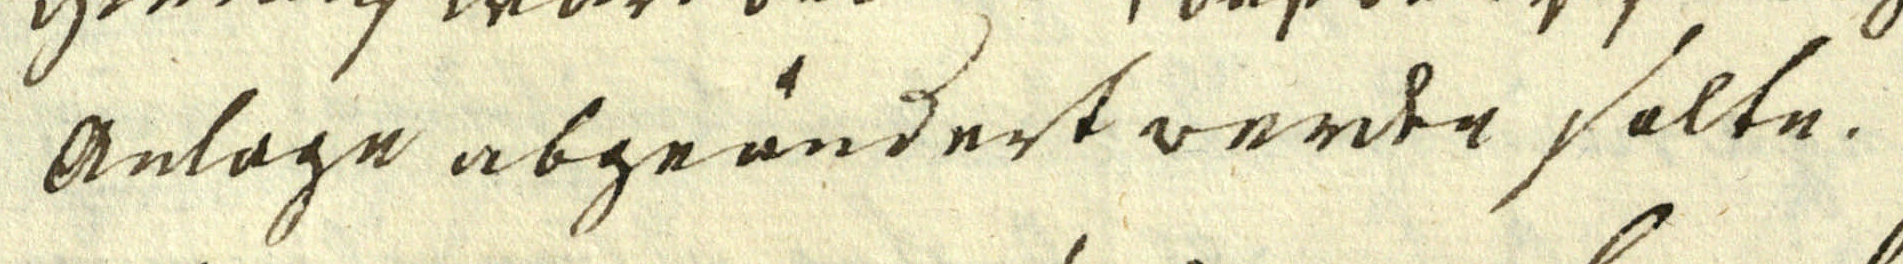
Anlage abgeändert werden solte.
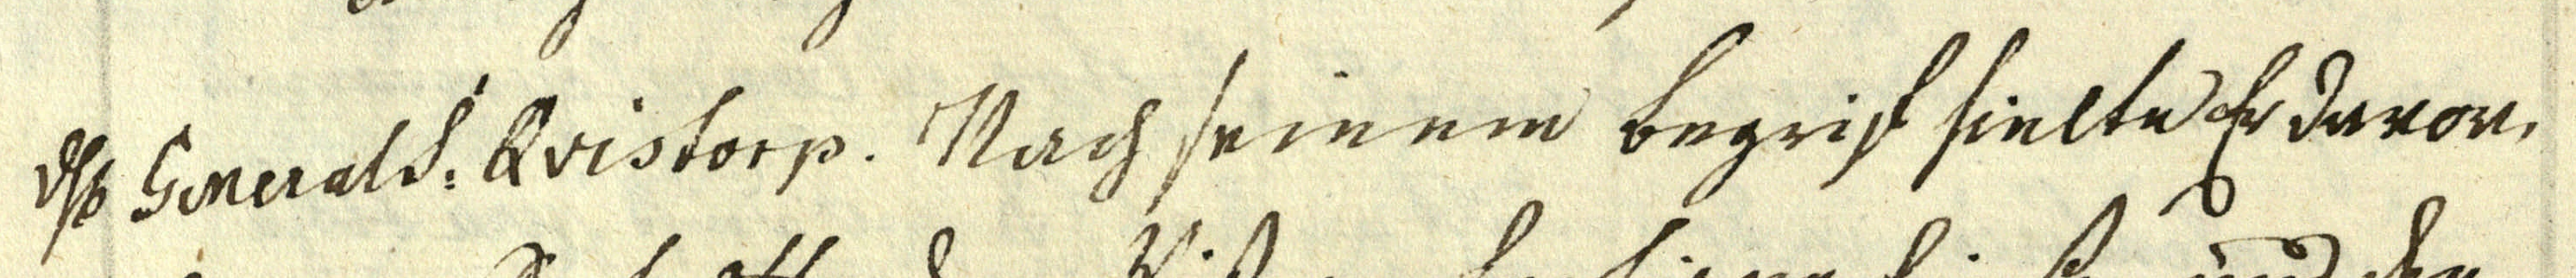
dh GeneralS. Quistorp Nach seinem Begrif hielte Er davor,
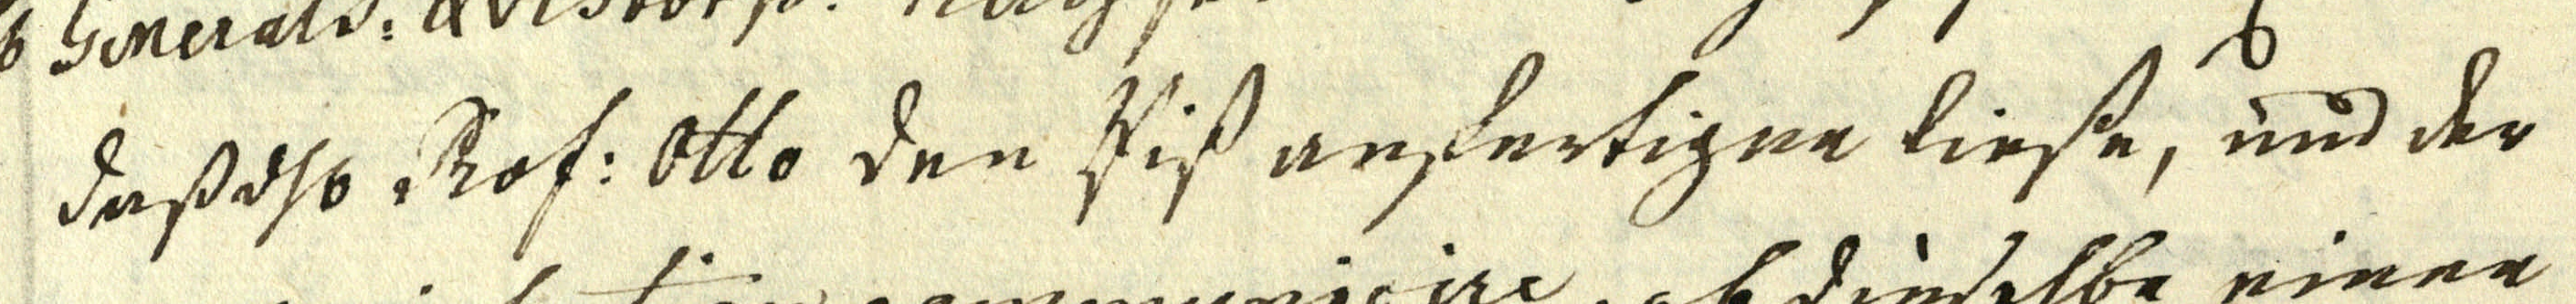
daß dh Prof. Otto den Riß anfertigen ließe, und der
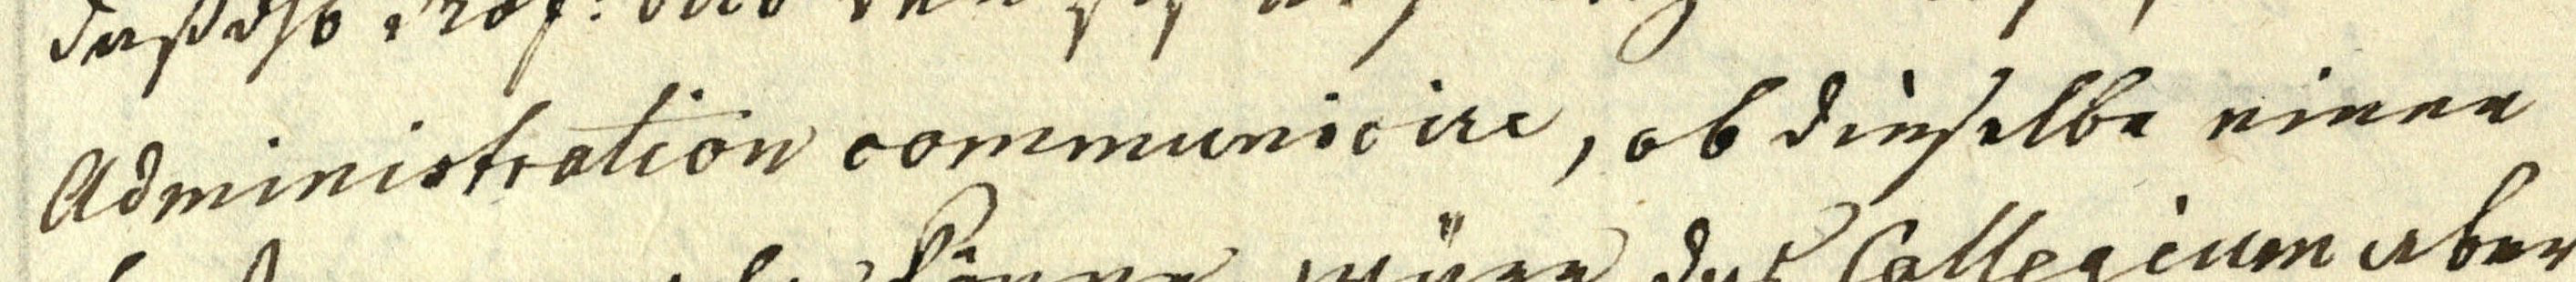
Administration communicire, ob dieselbe einen
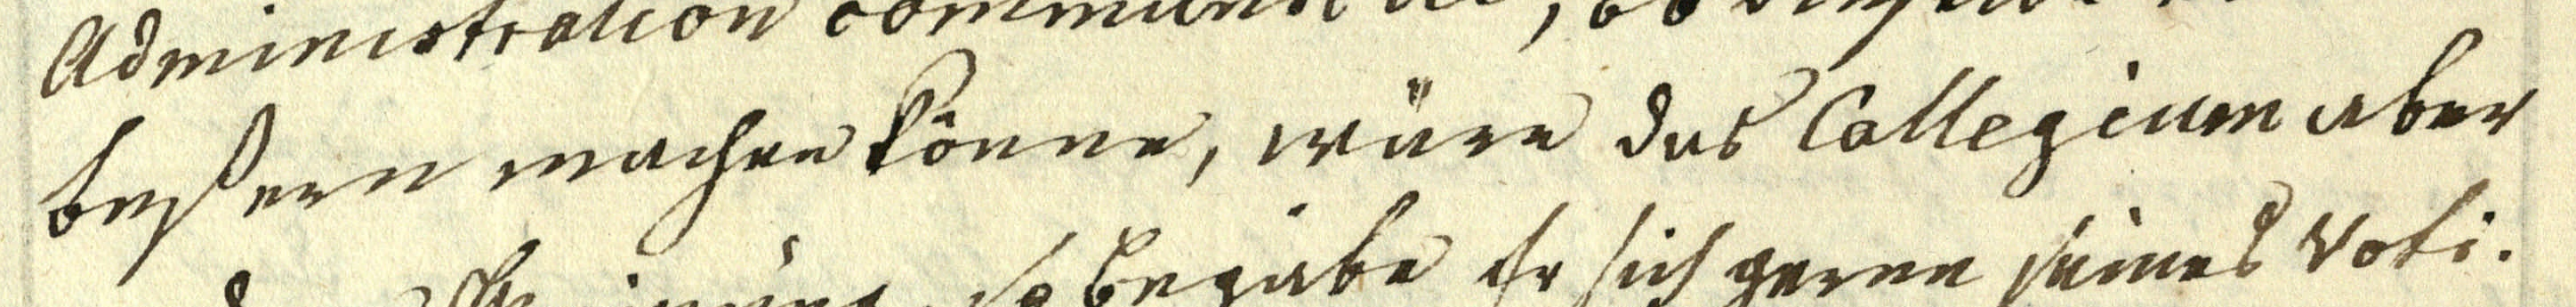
beßern machen könne, wäre das Collegium aber
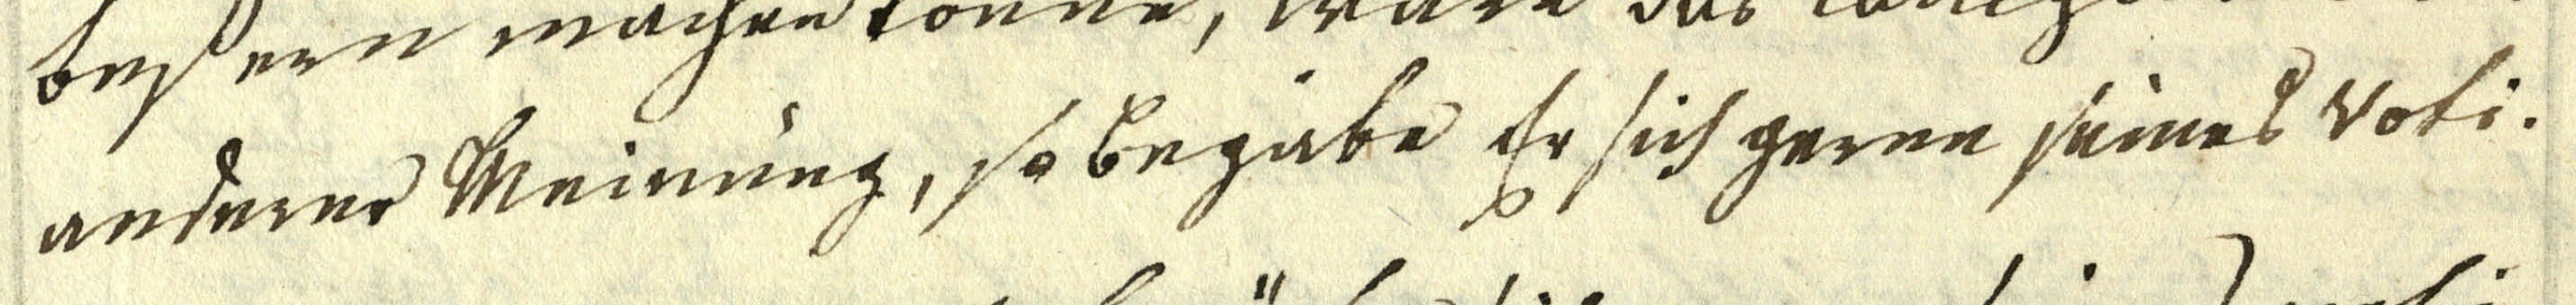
anderer Meinung, so begäbe Er sich gerne seines Voti.
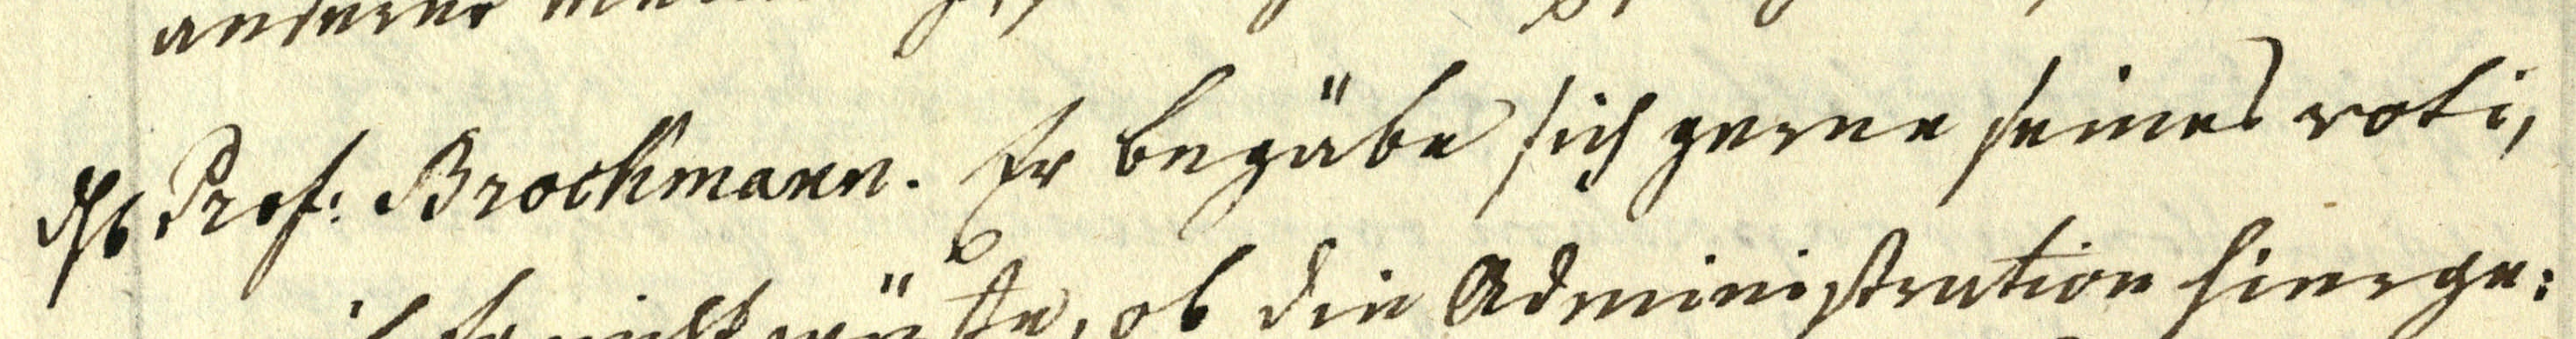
dh Prof. Brockmann. Er begäbe sich gerne seines voti,
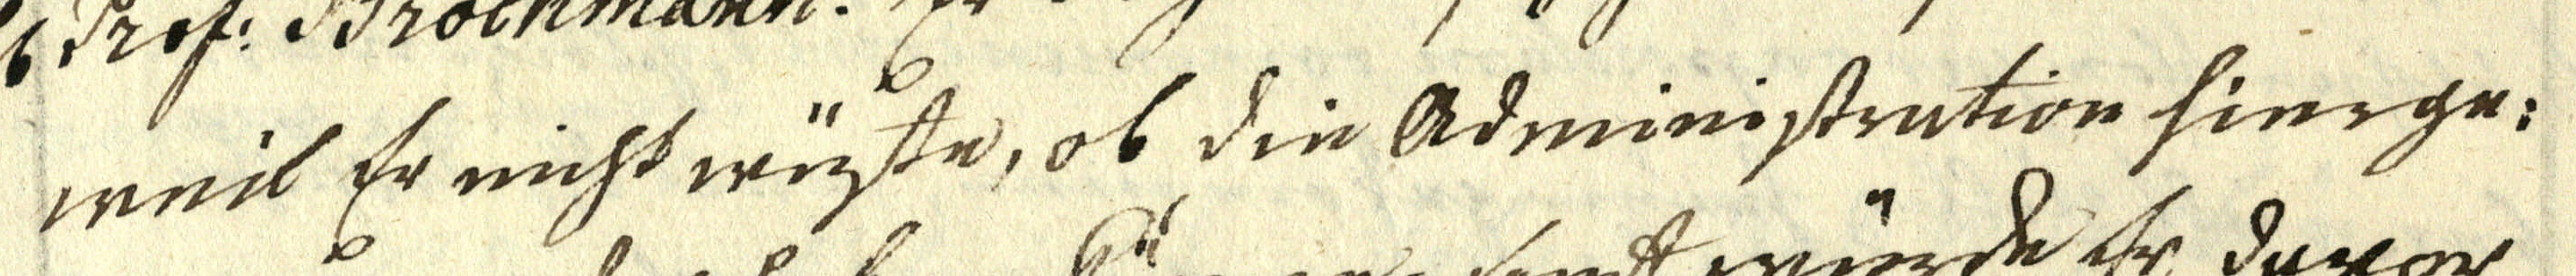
weil Er nicht wüste, ob die Administration hierge¬
